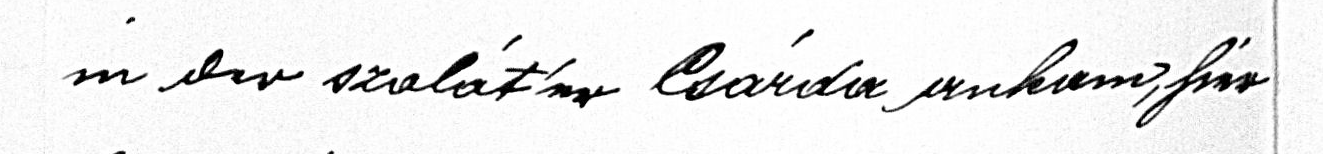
in der szolát'er Csárda ankam, hier
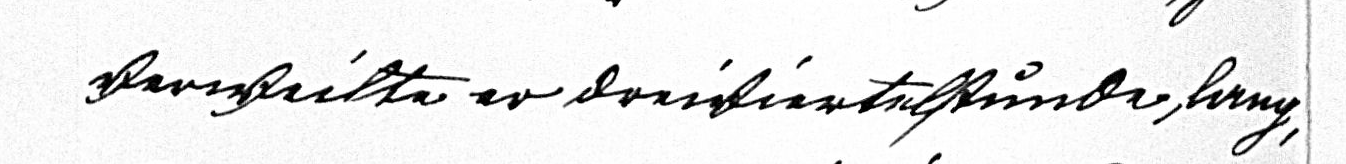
verweilte er dreiviertelstunde, lang,
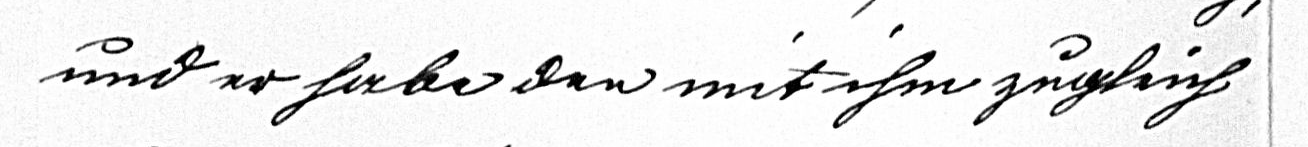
und er habe den mit ihm zugleich
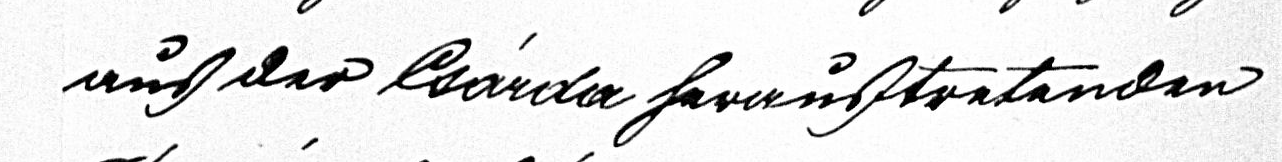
aus der Csárda heraustretenden
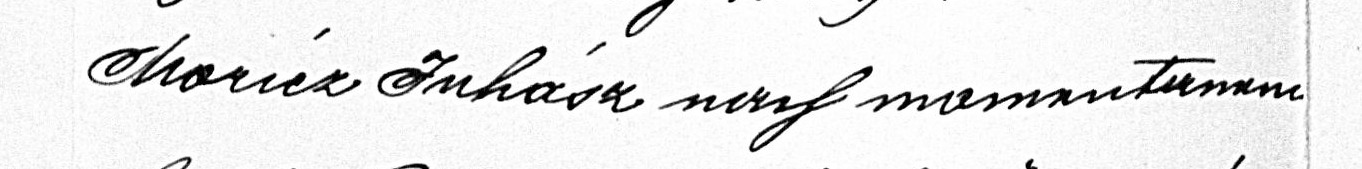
Moricz Inhász nach momentanem
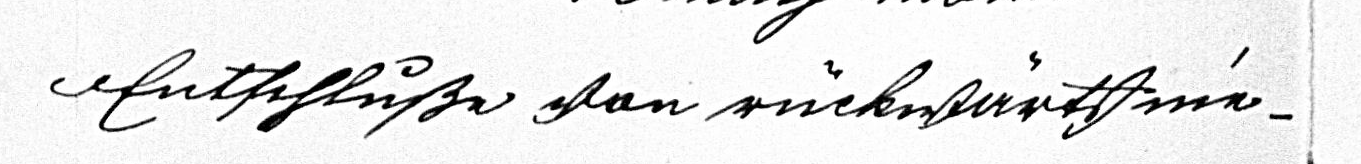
Entschluße von rückwärts nie¬
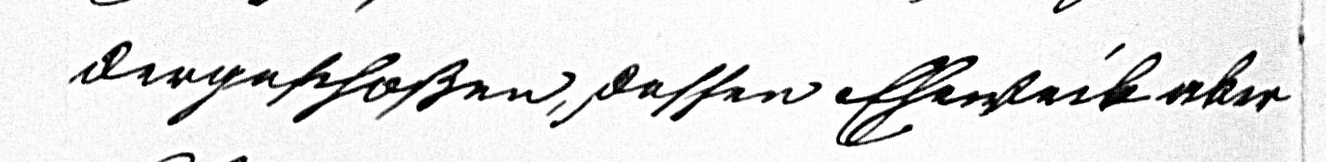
dergeschoßen, dessen Eheweib aber
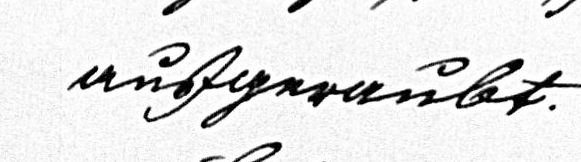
ausgeraubt.
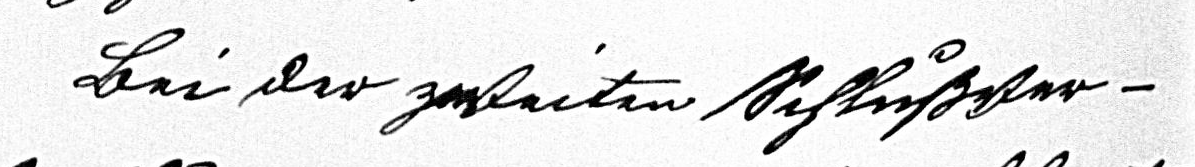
Bei der zweiten Schlußver¬
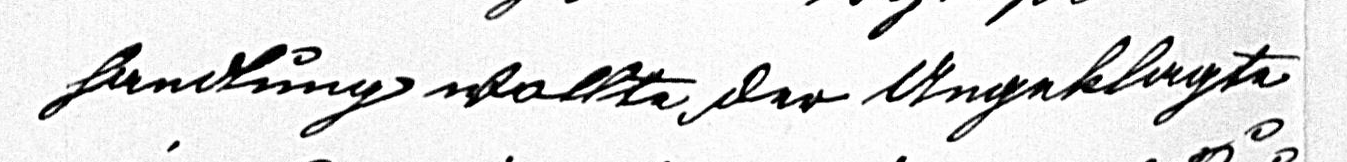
handlung wollte der Angeklagte
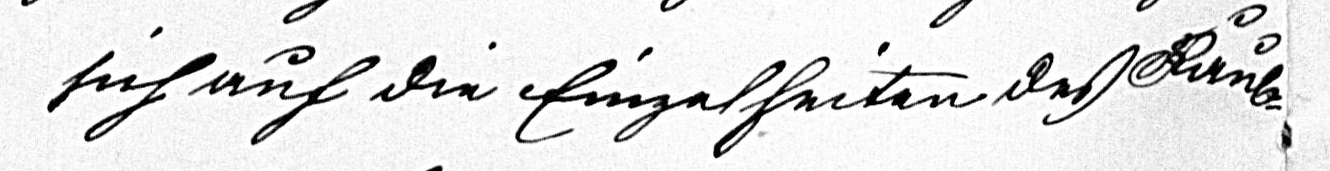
sich auf die Einzelheiten des Raub¬
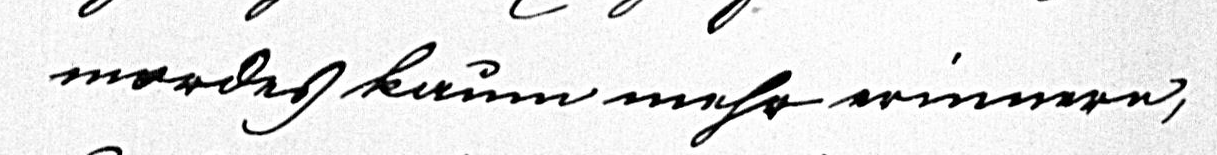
mordes kaum mehr erinnere,
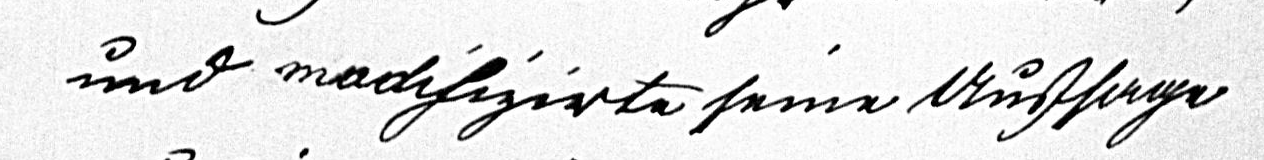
und madifizirte seine Aussage
